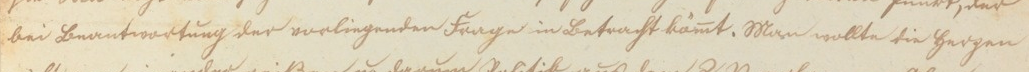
bei Beantwortung der vorliegenden Frage in Betracht kömmt. Man wollte die Herzen
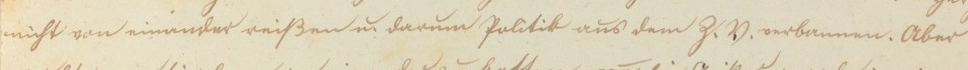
nicht von einander reißen u. darum Politik aus dem Z.V. verbannen. Aber
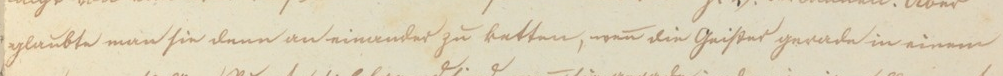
glaubte man sie denn an einander zu ketten, wenn die Geister gerade in einem
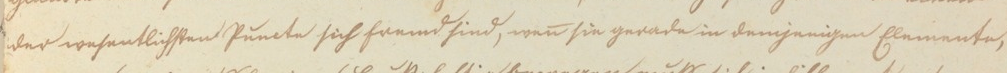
der wesentlichsten Puncte sich fremd sind, wenn sie gerade in demjenigen Elemente,
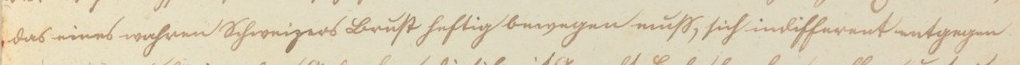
das eines wahren Schweizers Brust heftig bewegen muss, sich indifferent entgegen
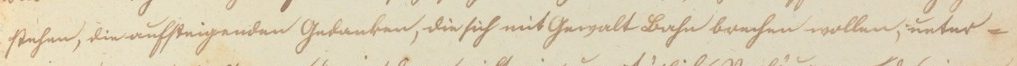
stehen, die aufsteigenden Gedanken, die sich mit Gewalt Bahn brechen wollen, unter-
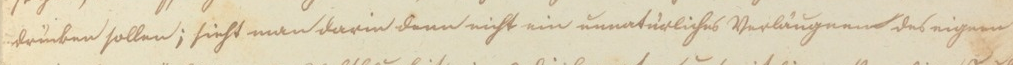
drücken sollen; sieht man darin denn nicht ein unnatürliches Verläugnen des eignen
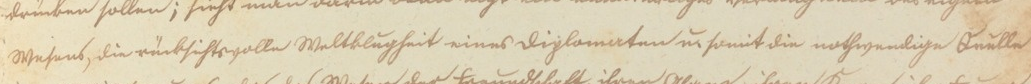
Wesens, die rücksichtsvolle Weltklugheit eines Diplomaten u. somit die nothwendige Quelle
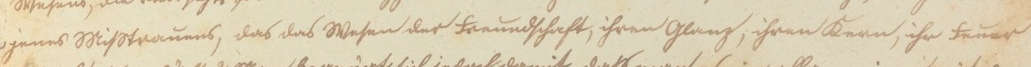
jenes Misstrauens, das das Wesen der Freundschaft, ihren Glanz, ihren Kern, ihr Feuer
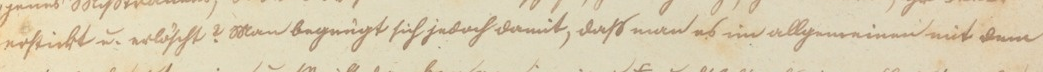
erstickt u. erlöscht? Man begnügt sich jedoch damit, dass man es im allgemeinen mit dem
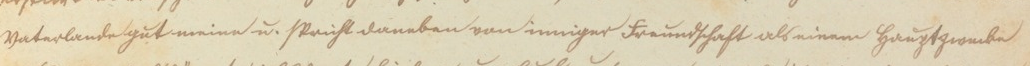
Vaterlande gut meine u. spricht daneben von inniger Freundschaft als einem Hauptzwecke
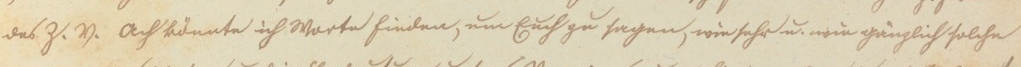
des Z.V. Ach könnte ich Worte finden, um Euch zu sagen, wie sehr u. wie gänzlich solche
